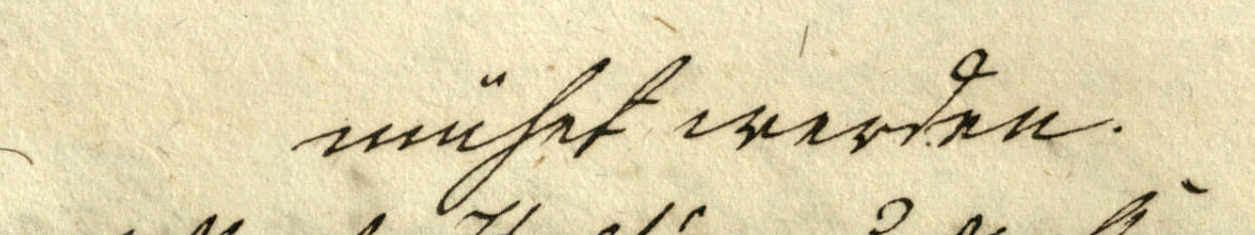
mühet werden.
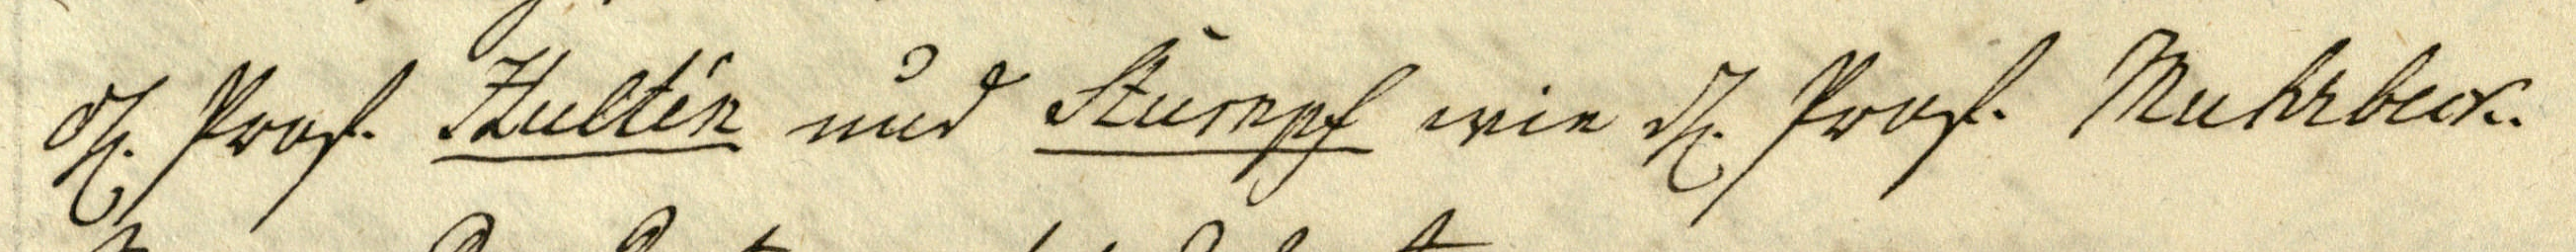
dh. Prof. Hultén und Stumpf wie dh. Prof. Murhbeck.
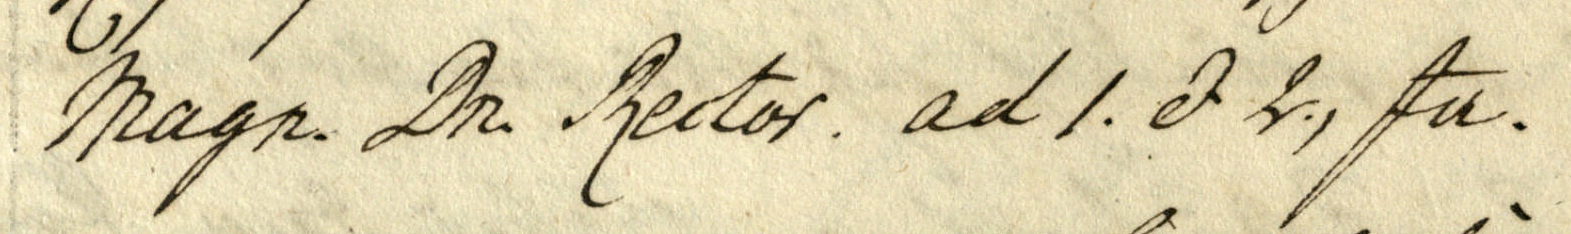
Magn. Dn. Rector. ad 1. et 2., Ja.
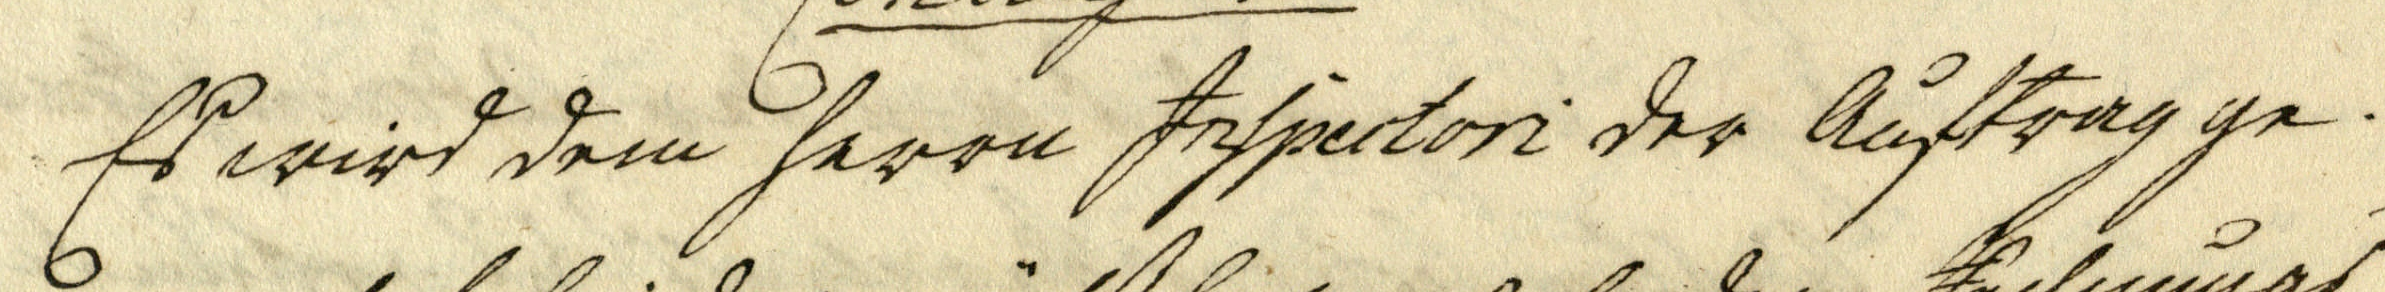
Es wird dem herrn Inspectori der Auftrag ge-
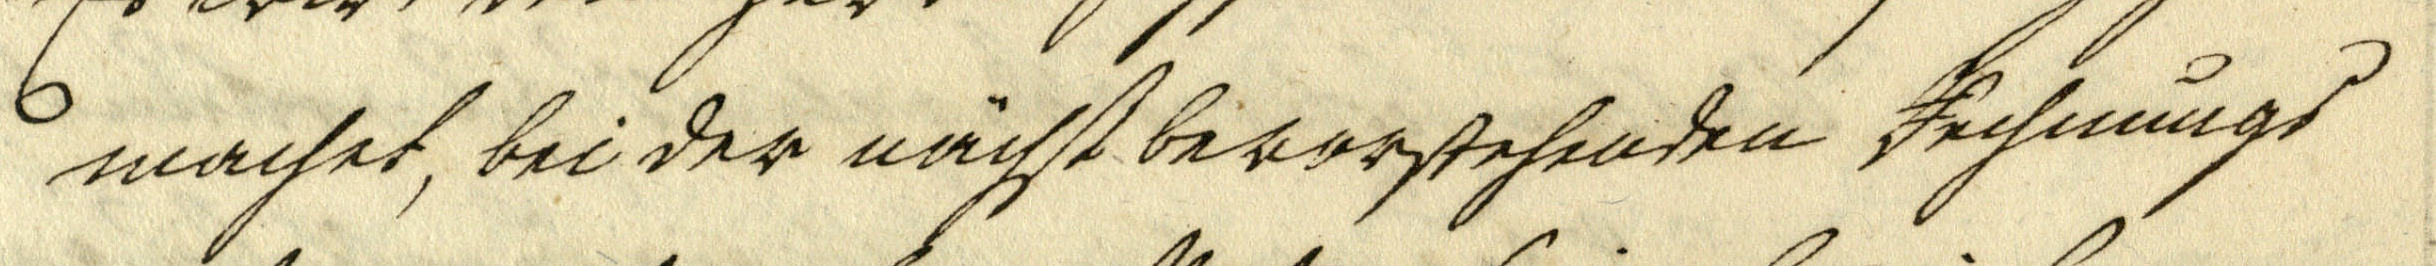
machet, bei der nächst bevorstehenden Rechnungs
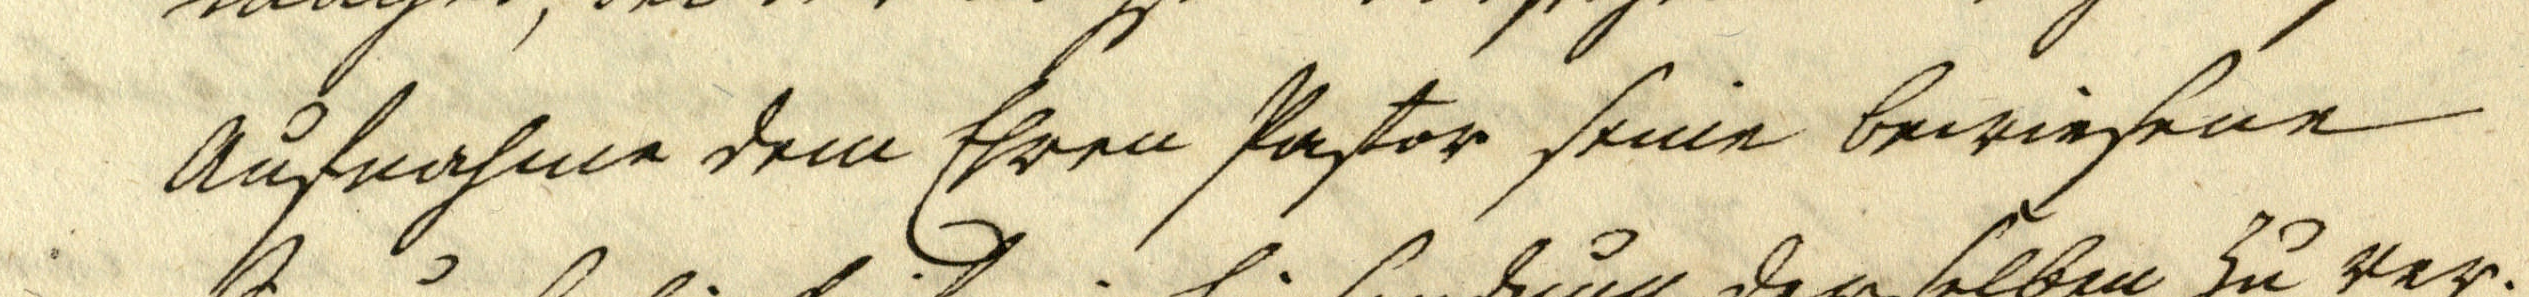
Aufnahme dem Ehren Pastor seine bewiesene
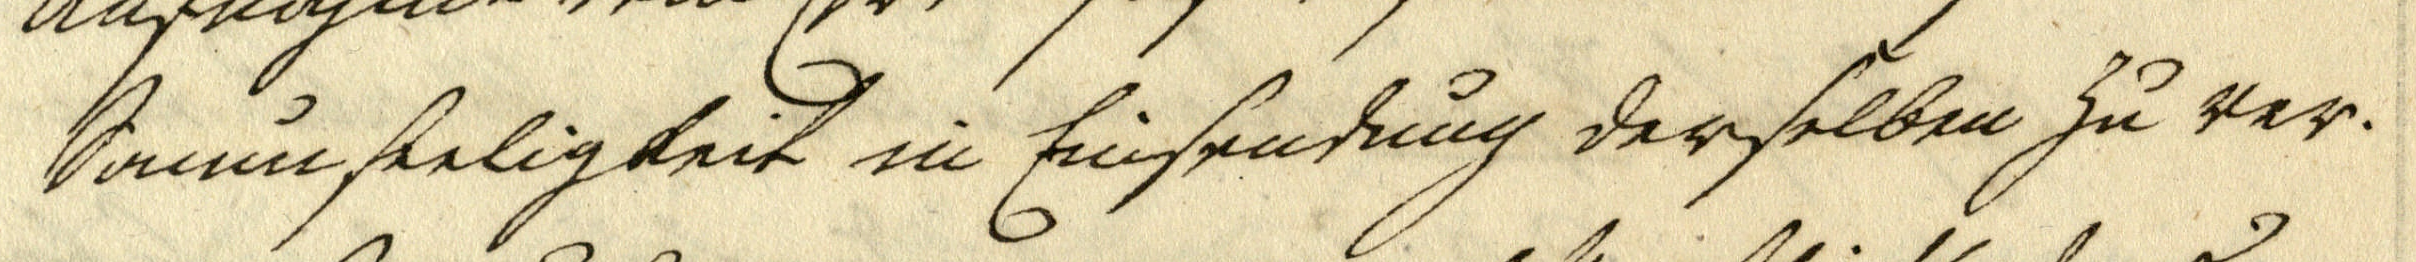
Saumseeligkeit in Einsendung derselben zu ver-
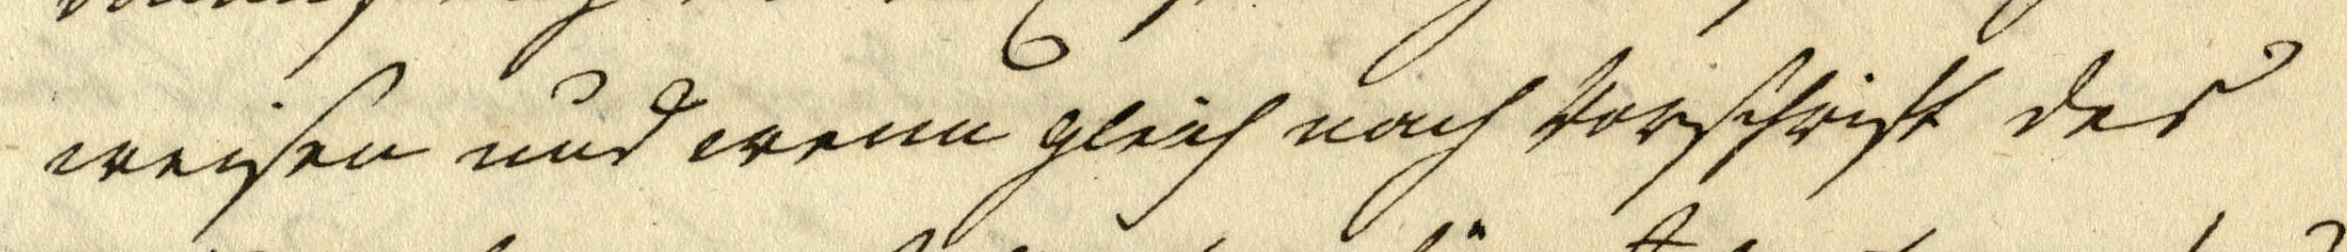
weisen und wenn gleich nach Vorschrift des
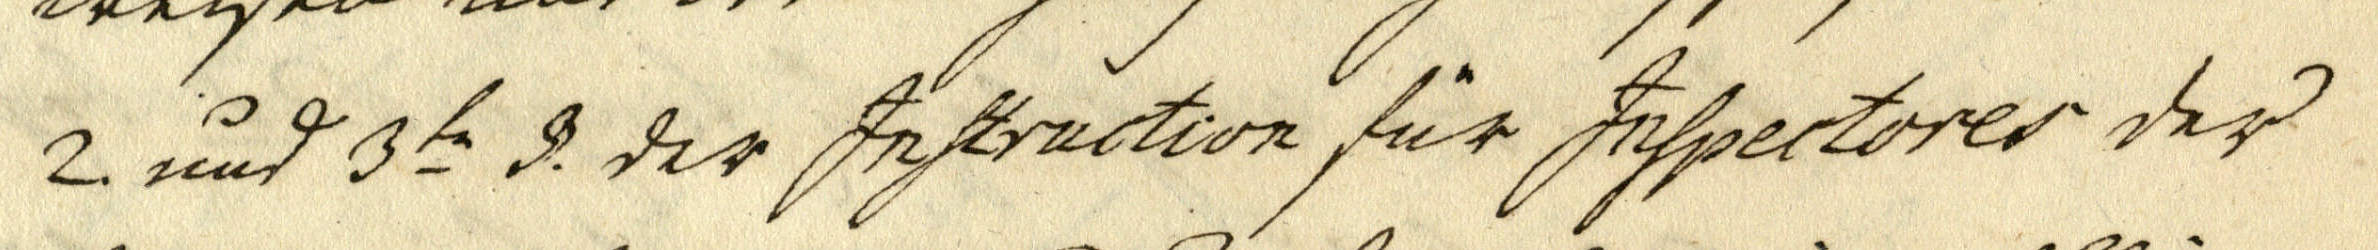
2. und 3ten § der Instruction für Inspectores der
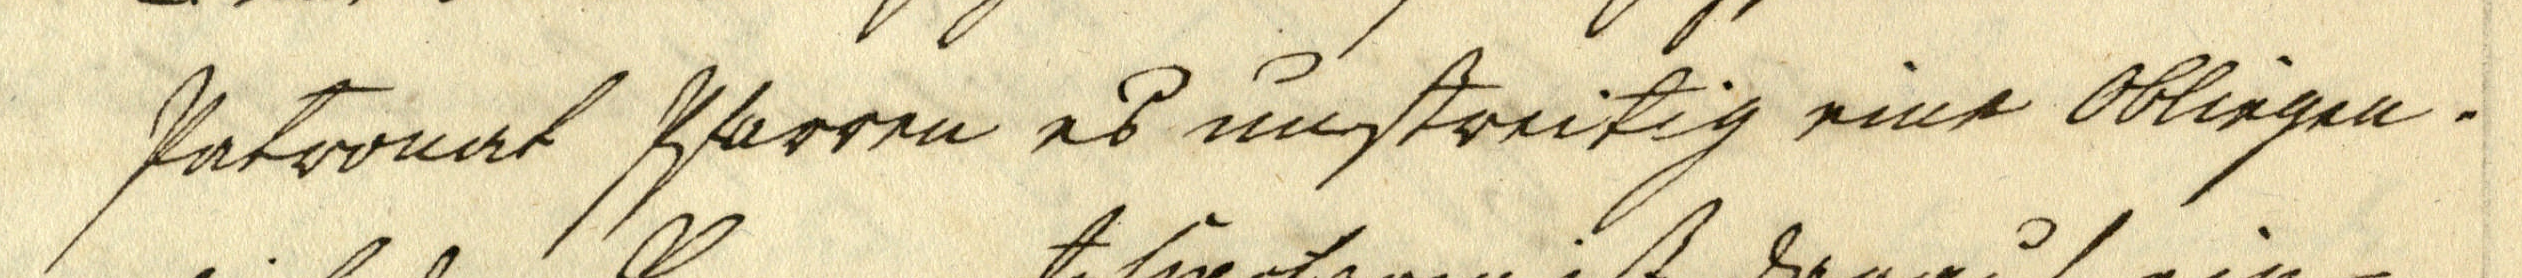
Patronat Pfarren es unstreitig eine Obliegen-
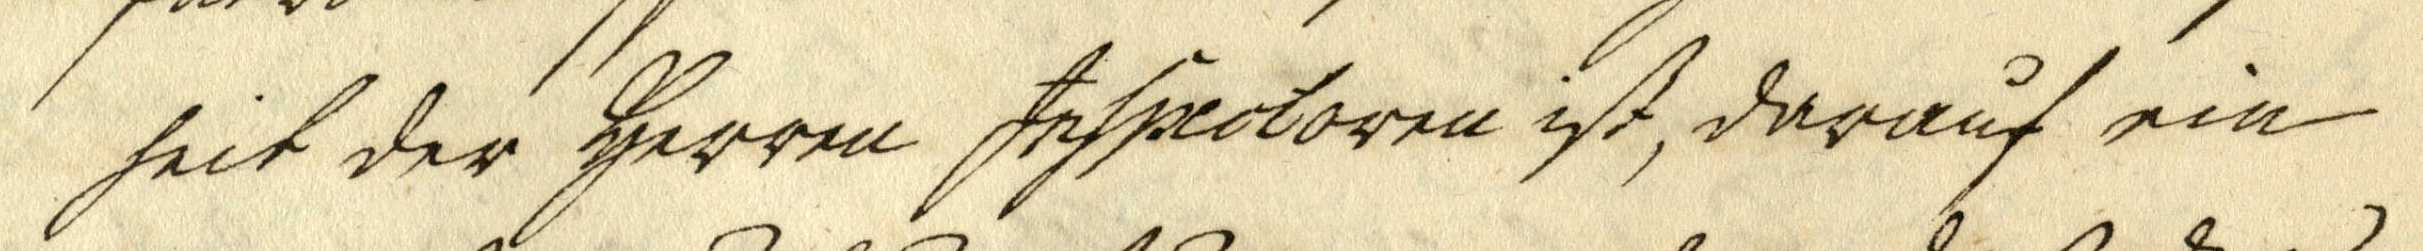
heit der Herren Inspectoren ist, darauf ein
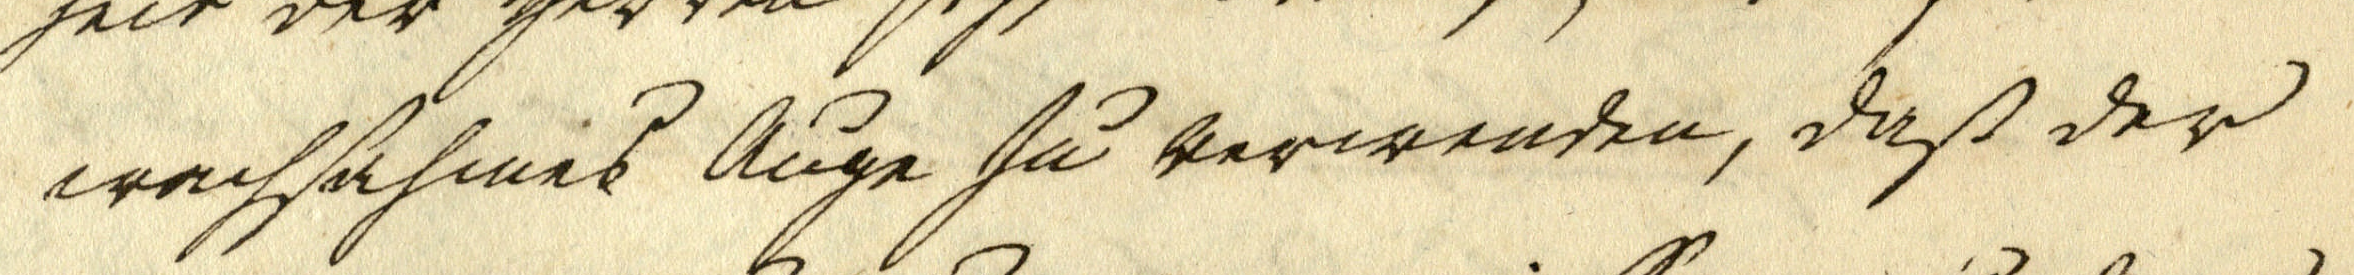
wachsahmes Auge zu verwenden, daß der
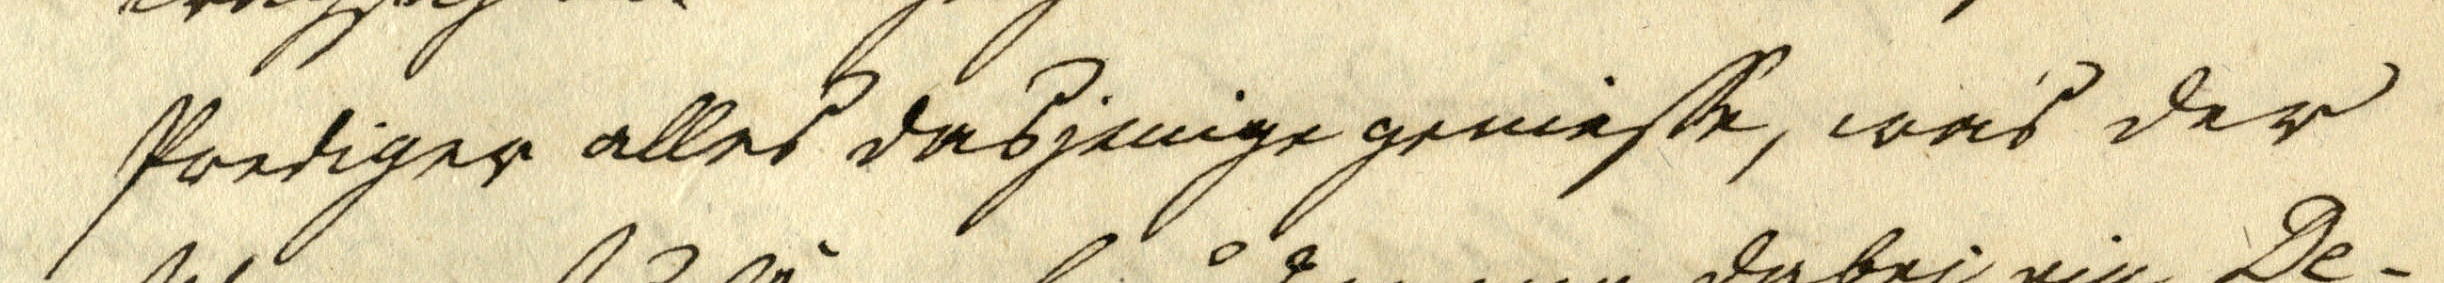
Prediger alles dasjenige geniesse, was der
